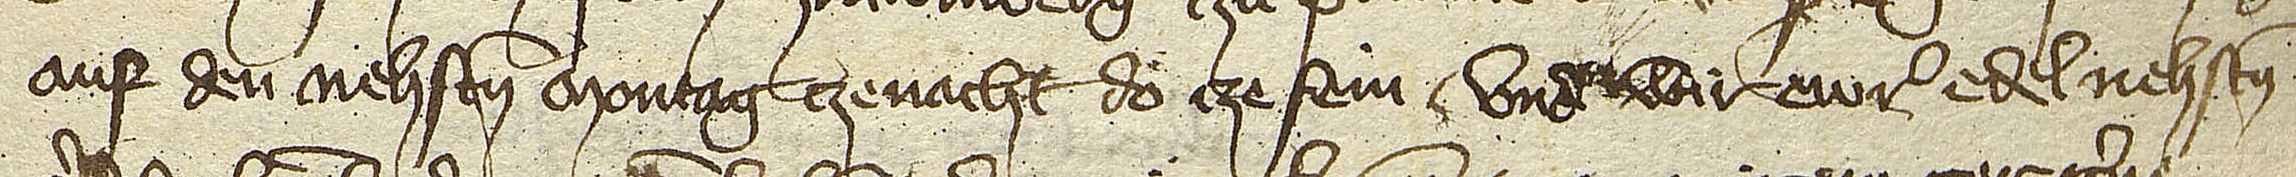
auf den nehſtn* Montag cʒenacht dö cʒe ſein / vnd wir ewr* edel nehſtn*
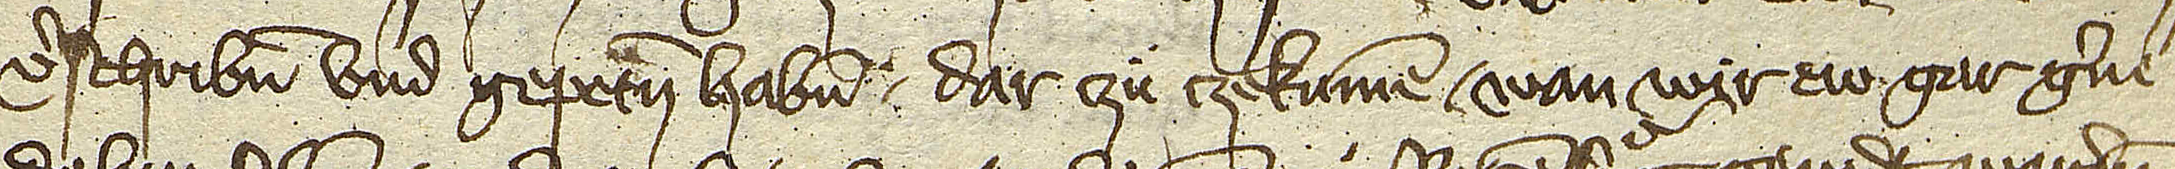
v*ſchribn* vnd gepetn* habn* / dar cʒü cʒekume* / wan wir gar g*ne
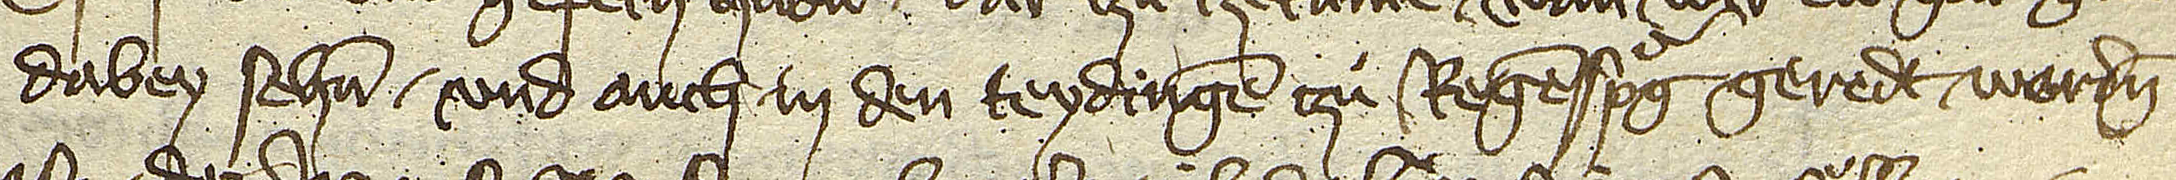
dabey ſehn* / vnd auch in den teydinge* cʒü Rege*ſp*g geredt wordn*
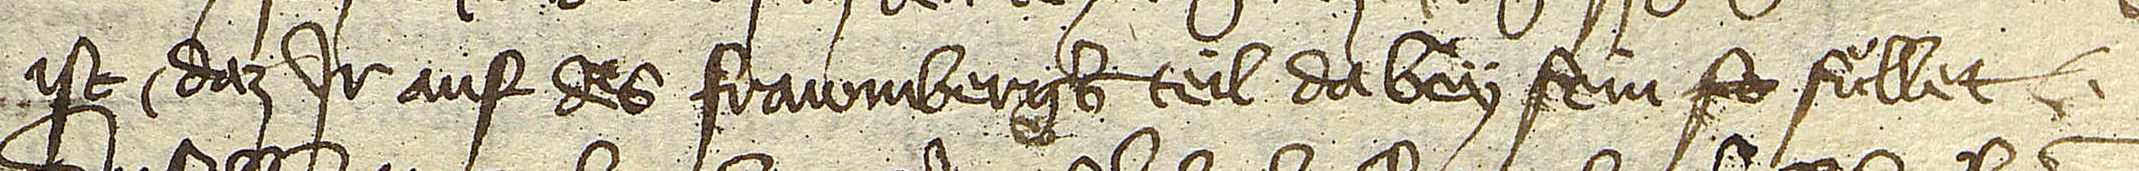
iſt / daʒ Ir auf des frawmberg*s teil dabey ſein ſo ſüllet / .
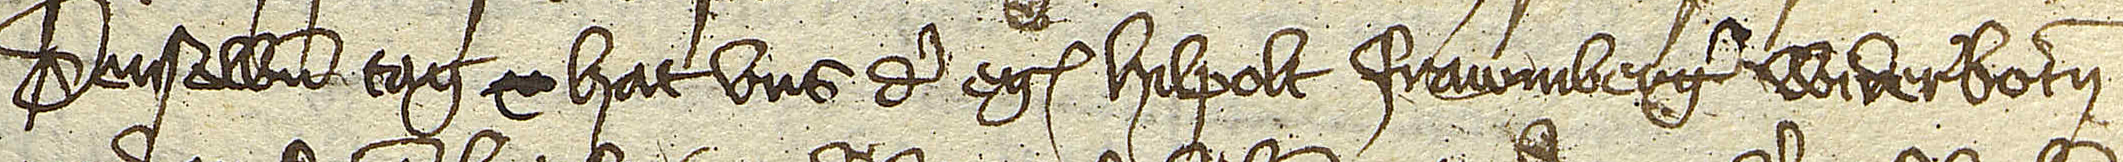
Denſelbn* tag v hat vns d* eg* hilpolt Frawmberg* widerbotn*
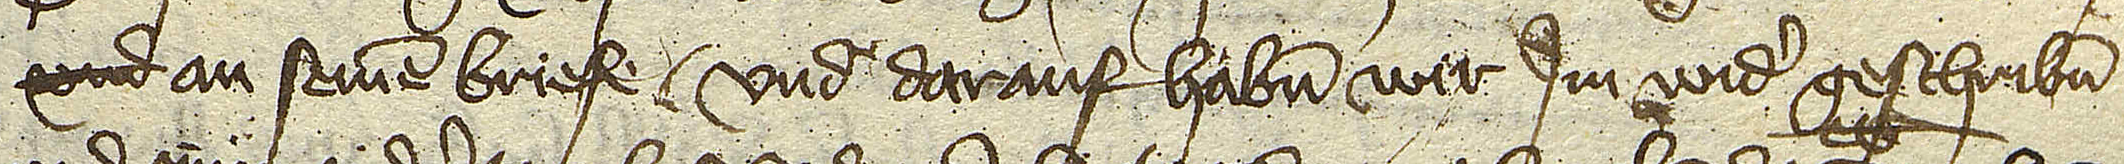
vnd an ſeine* briefe / vnd darauf habn* wir Im wid* geſchribn*
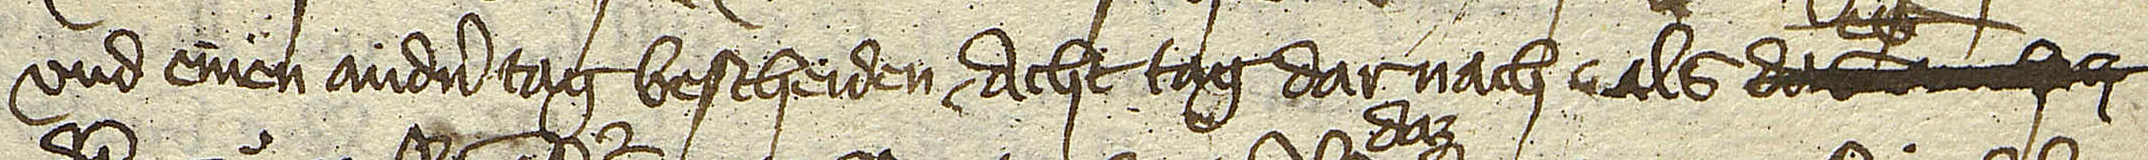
vnd einen andn* beſcheiden / Acht tag darnach / als das %%%%%%%%
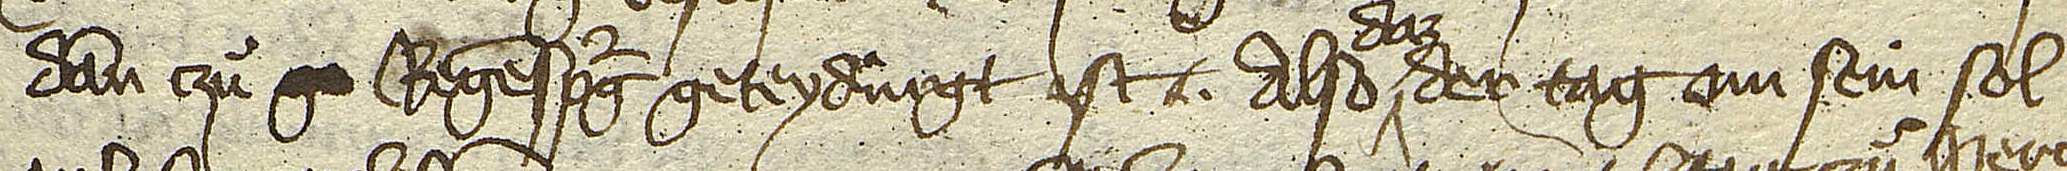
dan* cʒü ge Rege*ſp*g geteydingt iſt / . Alſo der tag nu ſein ſol
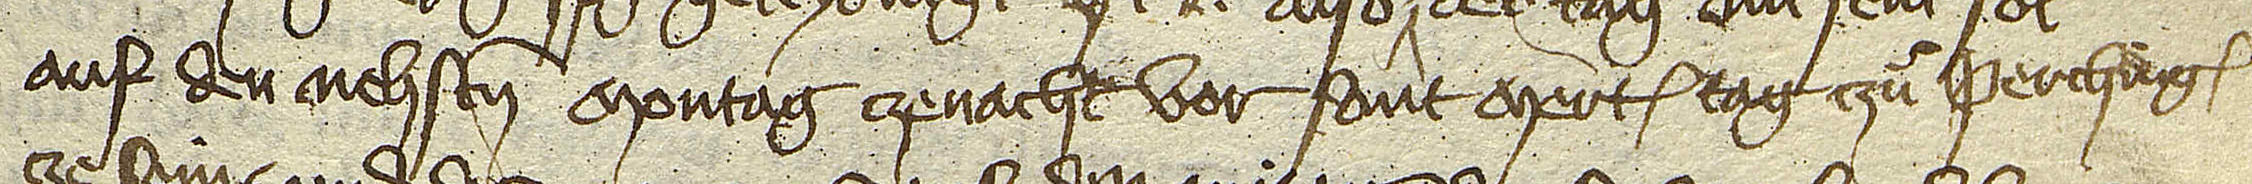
auf den nehſtn* Montag cʒenacht vor ſant Mert* tag cʒü Perching*
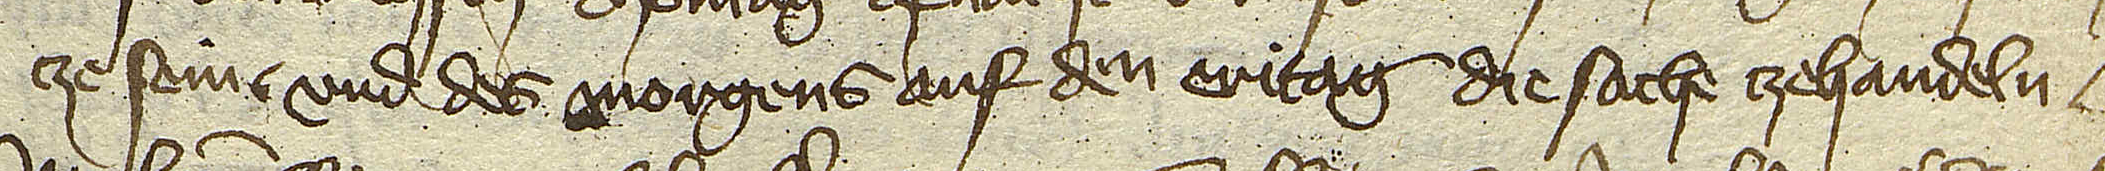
cʒe ſein / vnd des morgens auf den eritag die ſache cʒehandeln /
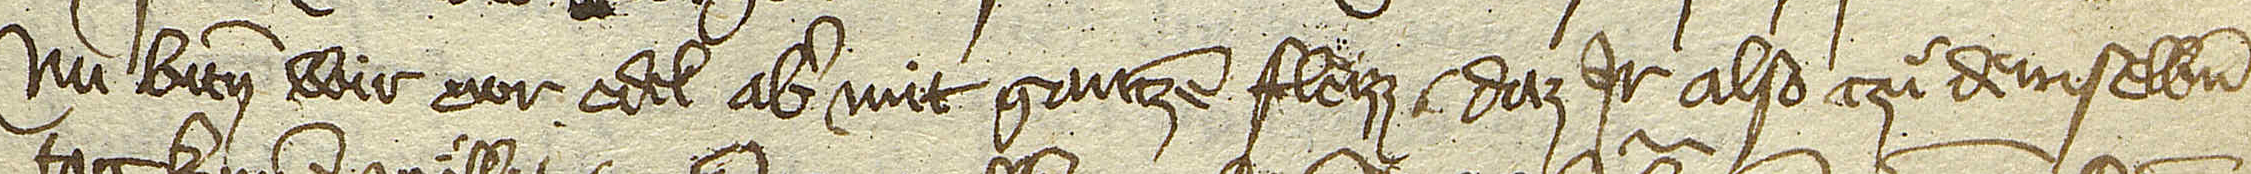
Nu bitn* wir ewr edel ab* mit gancʒe* fleiʒʒ / daʒ Ir alſo cʒü demſelbn*
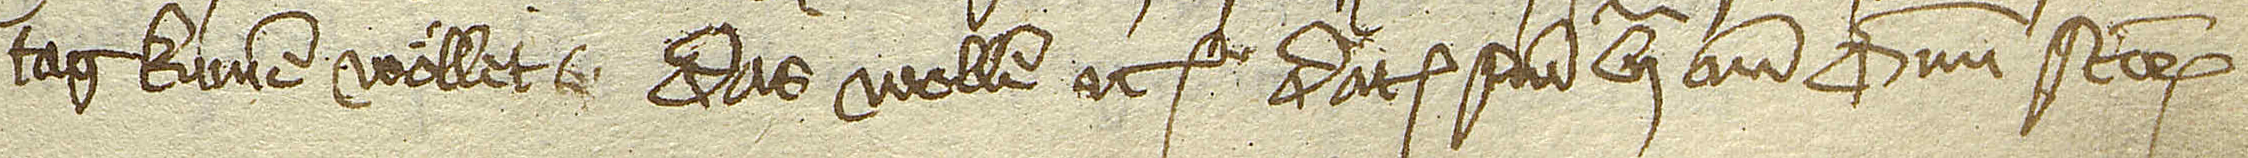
tag kume* wöllet / . Das wolle* ec* Dat* fia* vi* an* Omi* ſco*
